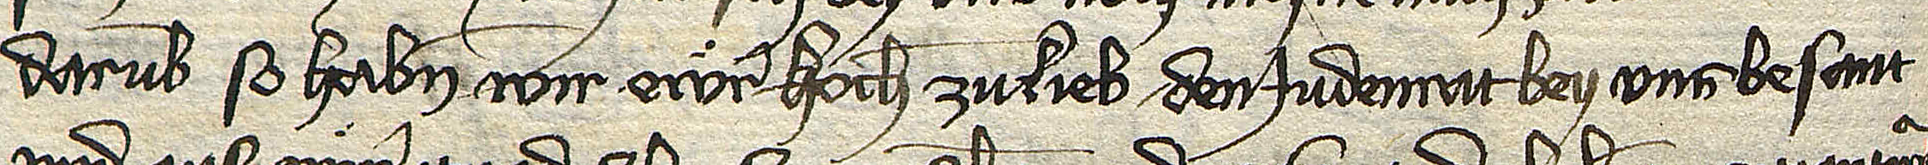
darub* ſo habn* wir eẅr* hoch* ʒulieb / den Iudenrat bey vns beſant
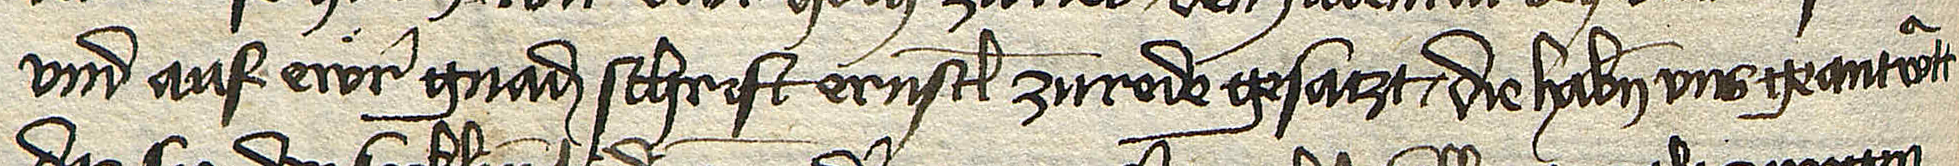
vnd auf eẅr* gnad* ſchrift ernſtl* ʒurede geſacʒt / Die habn* vns geantw*tt
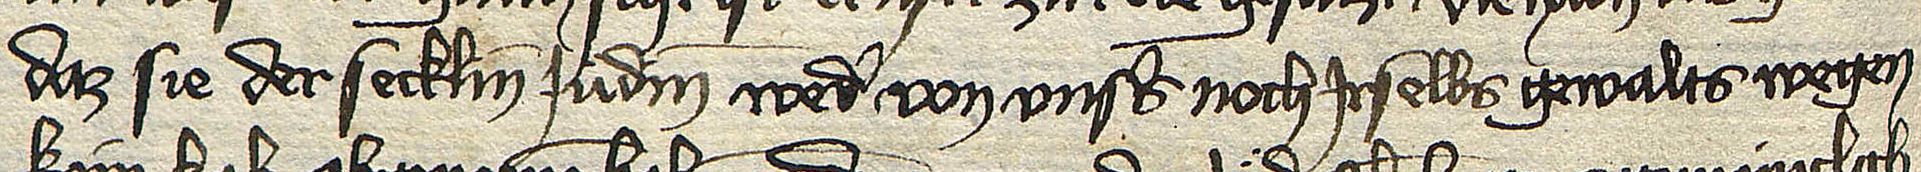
daʒ ſie der ſecklin Iüdin* wed* von vnſ*s noch Irſelbs gewalts wegen
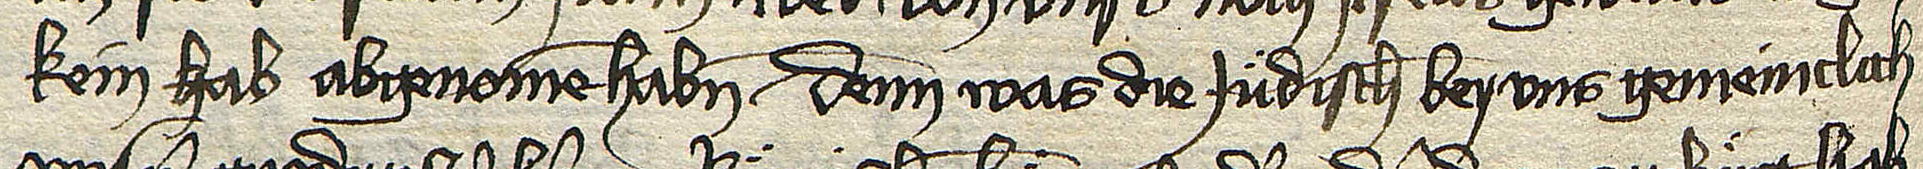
kein hab abgenome* habn* / Denn was die Iüdiſch* bey vns gemeinc*lich
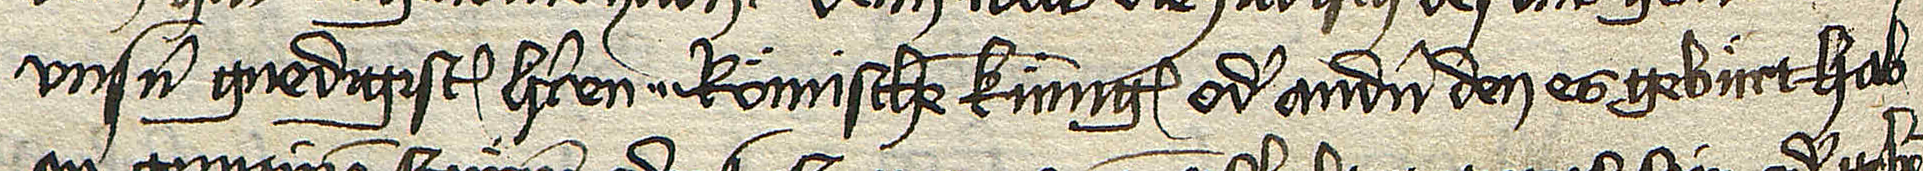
vnſn* gnedigiſt* h*ren ~ Römiſche* künig* od* andn* den es gebürt hab
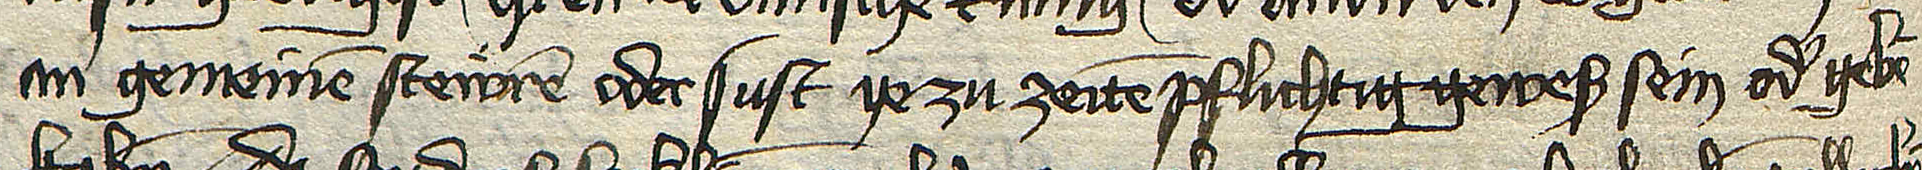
an gemeine* ſteẅre* oder ſuſt ye ʒu ʒeite* pflichtig geweſ* ſein od* gebe*
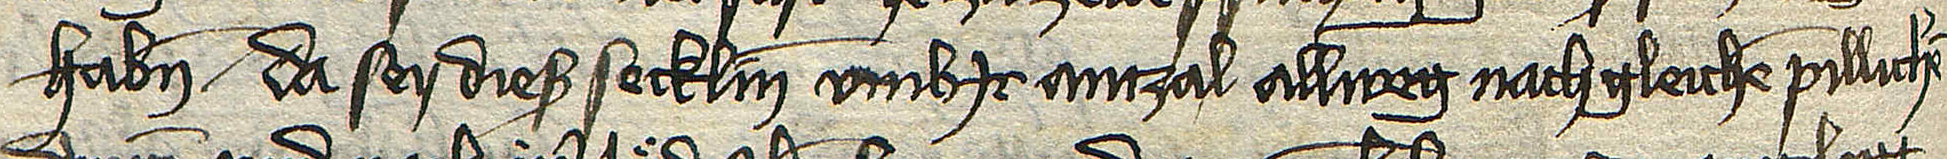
habn* / Da ſey dieſ* ſecklin* vmb Ir ancʒal allweg nach gleiche* pilliche*
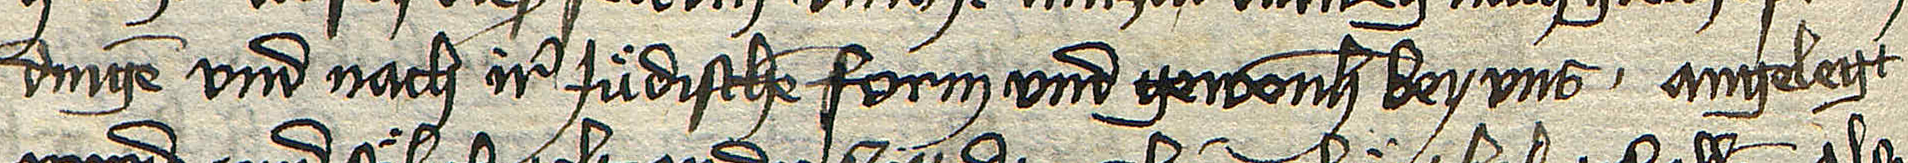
dinge* vnd nach ir* Iüdiſche* form vnd gewonh* bey vns / angelegt
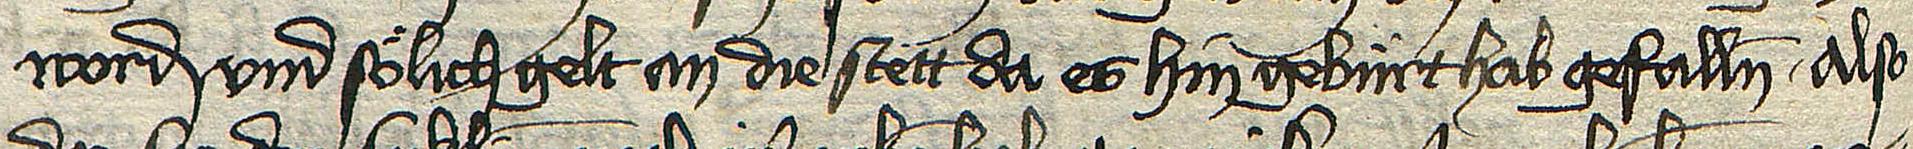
word* vnd ſölich gelt an die ſtett da es hin gebürt hab gefalln* / alſo
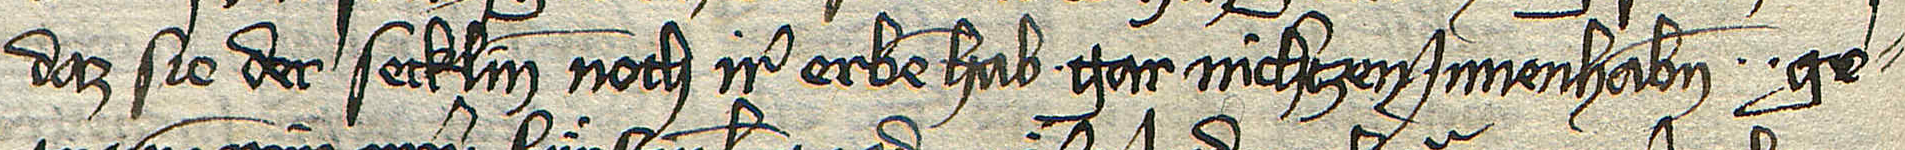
daʒ ſie der ſecklin* noch ir* erbe* hab . gar nichcʒen Innenhabn* ge =
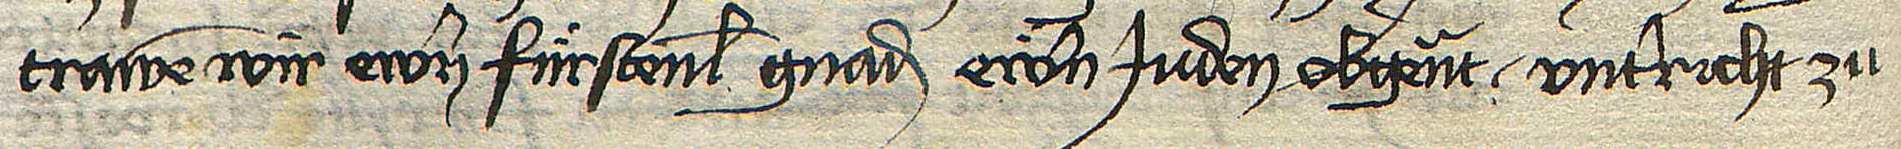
trawe* wir ew*n fürſtenl* gnad* eẅ*n Iuden obgent* / vnt*richt ʒu
